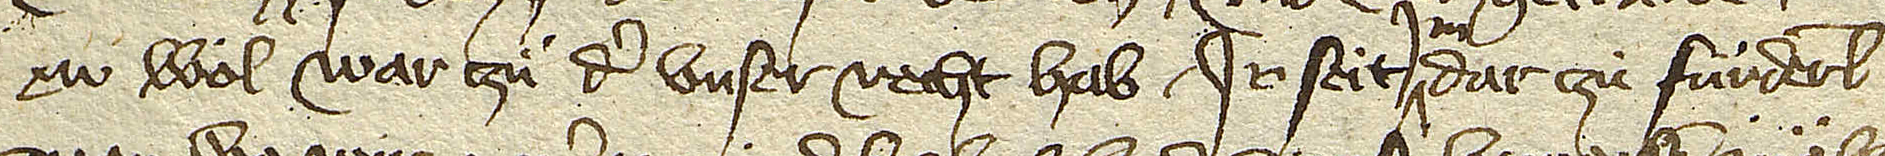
ew wol war cʒü d* vnſer recht hab / Ir ſeit dar cʒü fürderl*
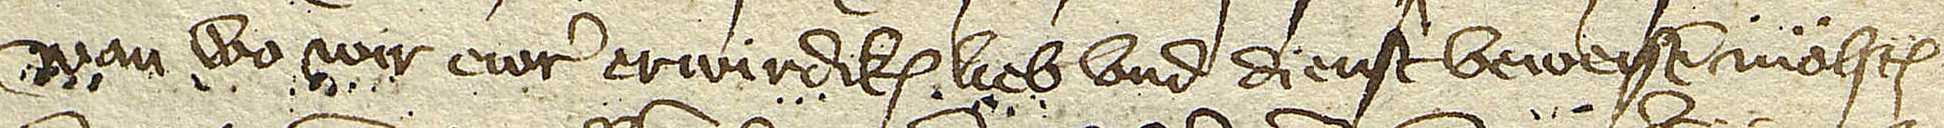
wan wo wir ewr* erwirdik* lieb vnd dienſt beweiſe* möht*
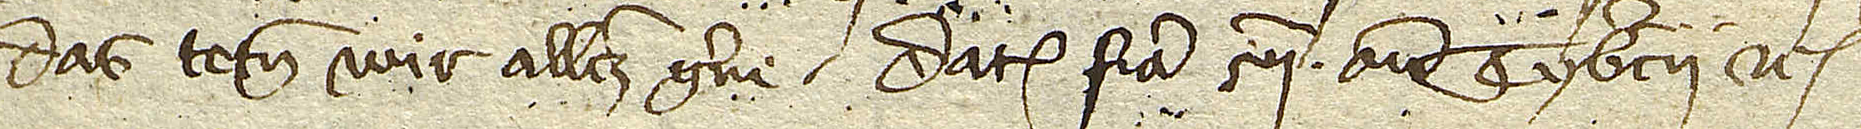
das tetn* wir allcʒ* g*ne / Dat* fia* iii* an* Tyb*rii* ec*
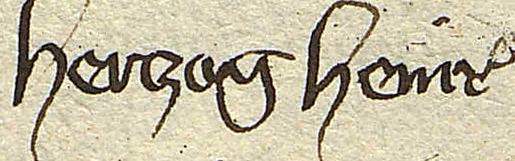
hercʒog heinr*
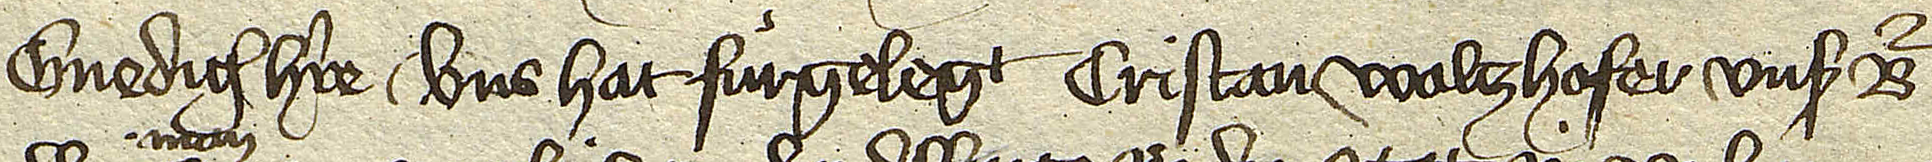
Gnedig* h*re / Vns hat fürgelegt Criſtan wolcʒhofer vnſ* B*
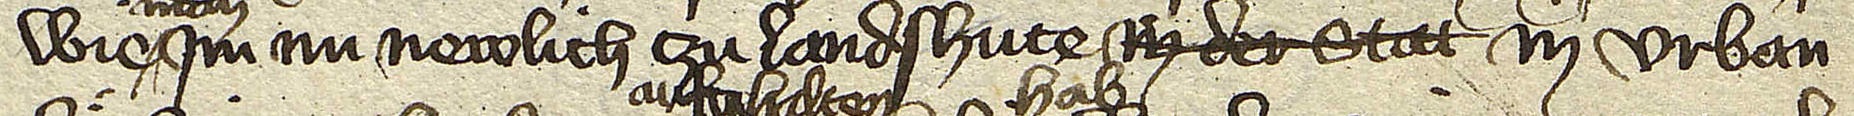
wie Im nu newlich cʒu landſhute in der Stat in Vrban
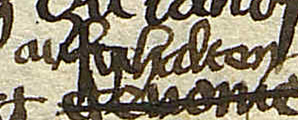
aufgehalten
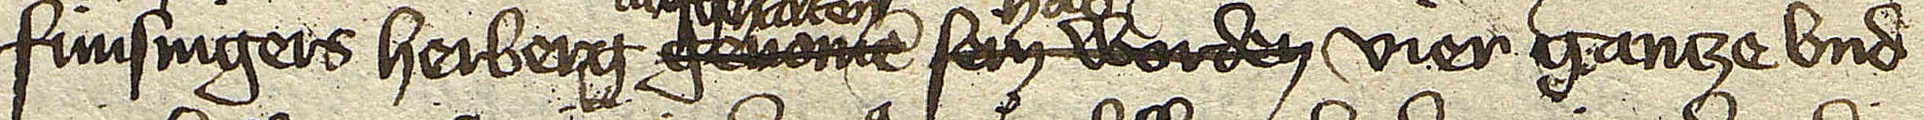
Fünſnigers herberg genome* ſein worden vier gancʒe vnd
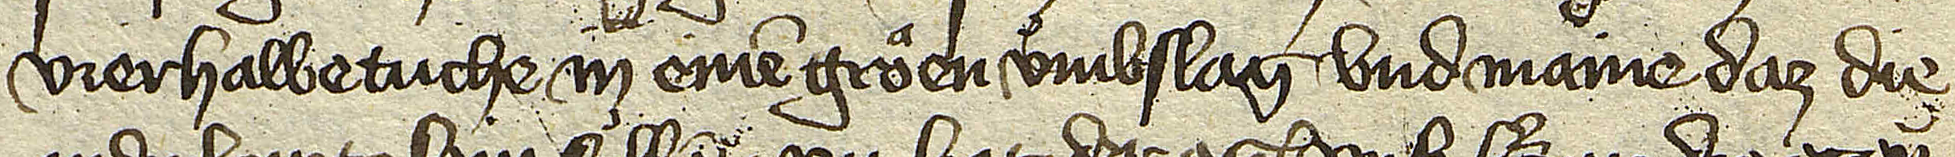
vierhalbe tuche in eine* gröen v̈mbſlag / vnd maine daʒ die
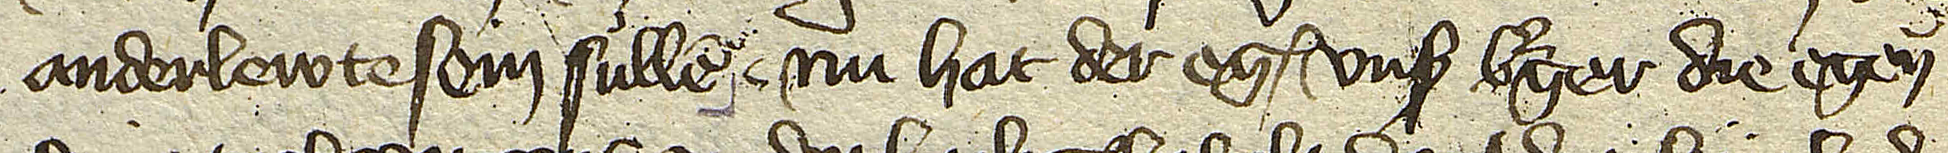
anderlewte ſein ſülle* / nu hat der eg* vnſ* b*ger die egen*
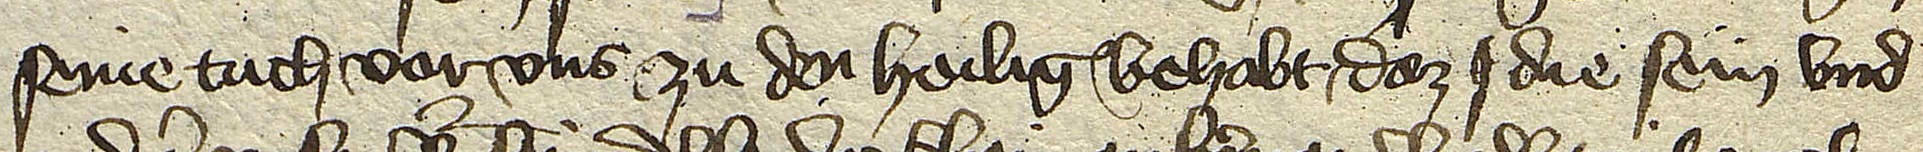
ſeine tuch vor vns cʒu den heilig* behabt / daʒ % die ſein vnd
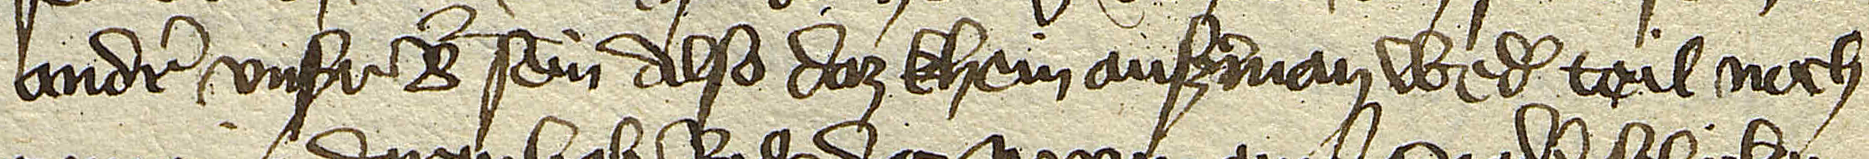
andr* vnſ*r B* ſein Alſo daʒ khein auſʒ*man wed* teil noch
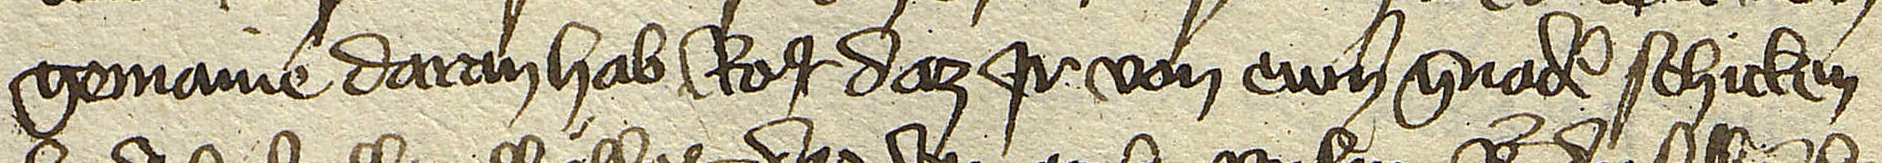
gemaine daran hab / Ro* / daʒ Ir von ewn* gnad* ſchicken
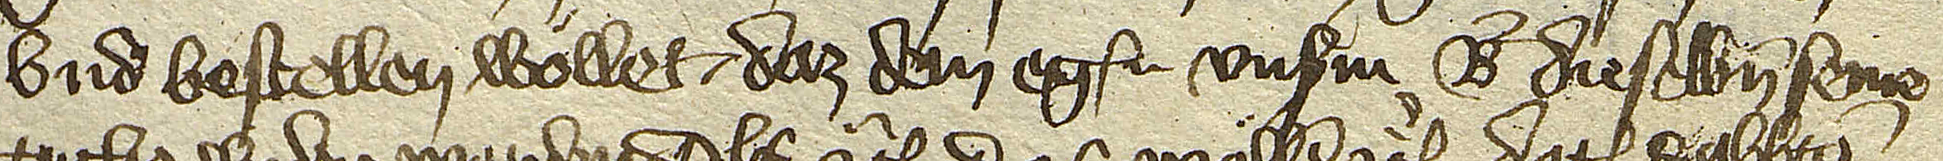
vnd beſtellen wöllet / daʒ dem eg* ~ vnſ*m B* dieſelbn* ſeine
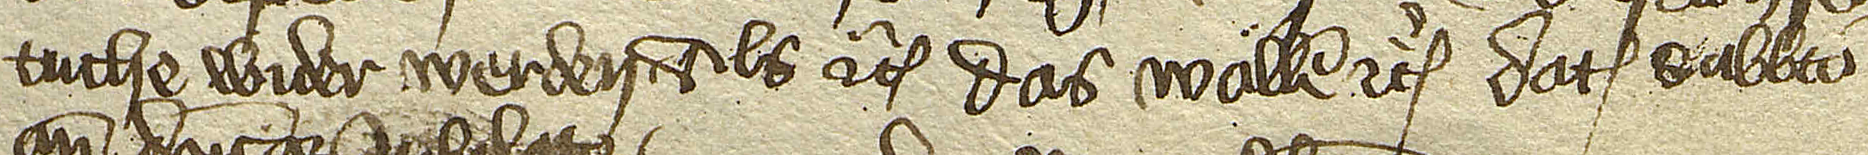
tuche wider werden / Als ec* das wölle* ec* dat* Sabbto*
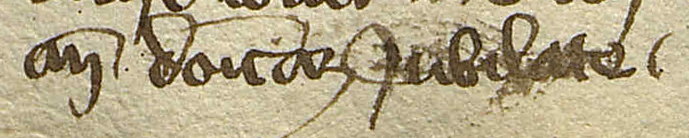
an* doica* Iubilate /
